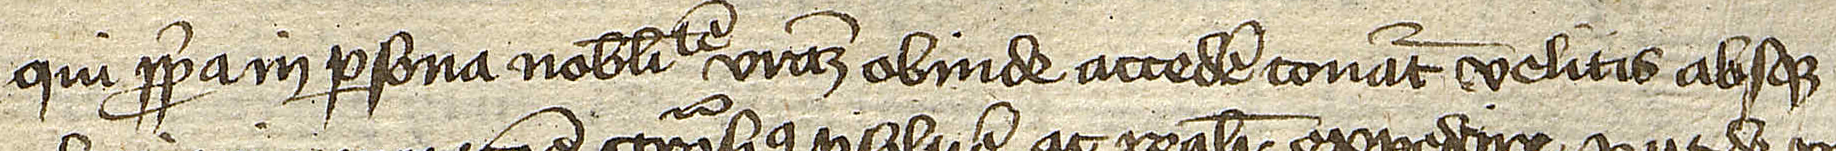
in p*ſona nob*li* v*ra* obinde accede* conat* velitis abſq*
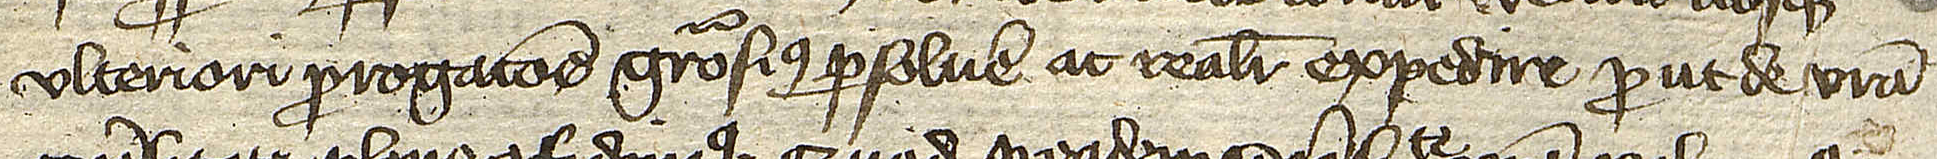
vlteriori p*rogac*o*e g*r*oſi* p*ſolue* ac real*r expedire p*ut de v*ra
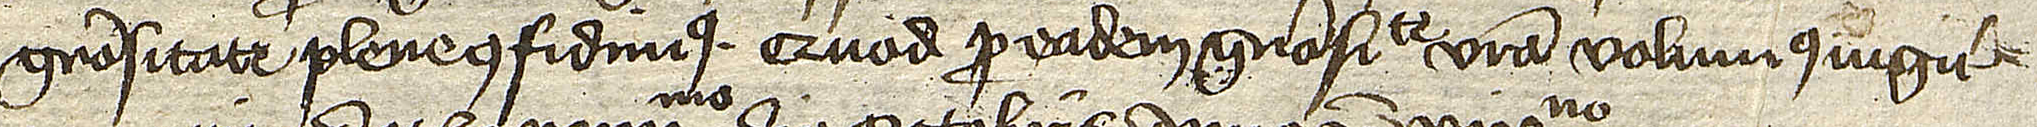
g*n*roſitate plene *fidimus . Quod p* eadem g*n*oſi*te v*ra volumu* *iugit*
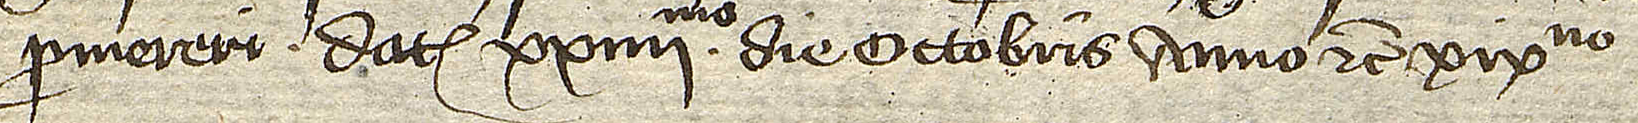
p*mereri . Dat* xxiiii* . die Octobris Anno ec* xix*
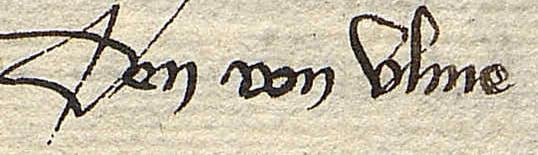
Den von Vlme
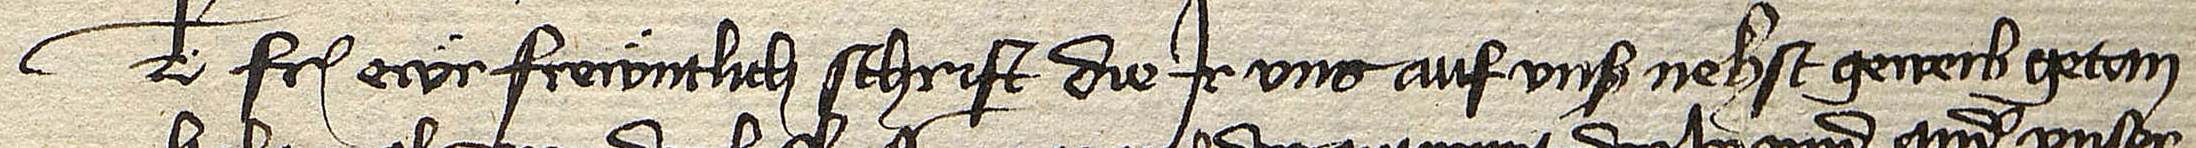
L* fr* eẅr freẅntlich ſchrift die Ir vns auf vnſ* nehſt gewerb getan
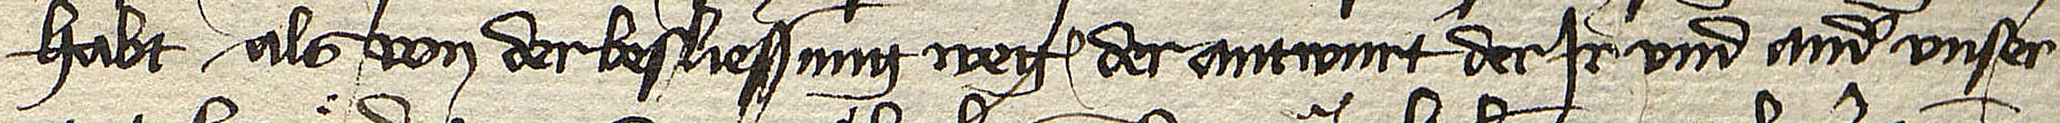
habt / als von der beſlieſſung weg* der antwurt der Ir vnd and* vnſer
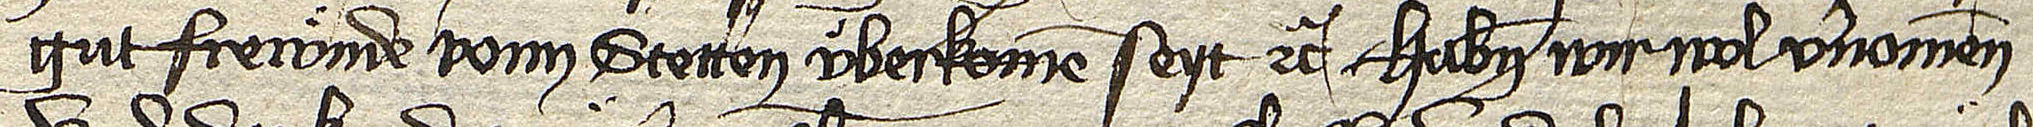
gut freẅnde vonn Stetten v̈berkome* ſeyt ec* / habn* wir wol v*nom*en
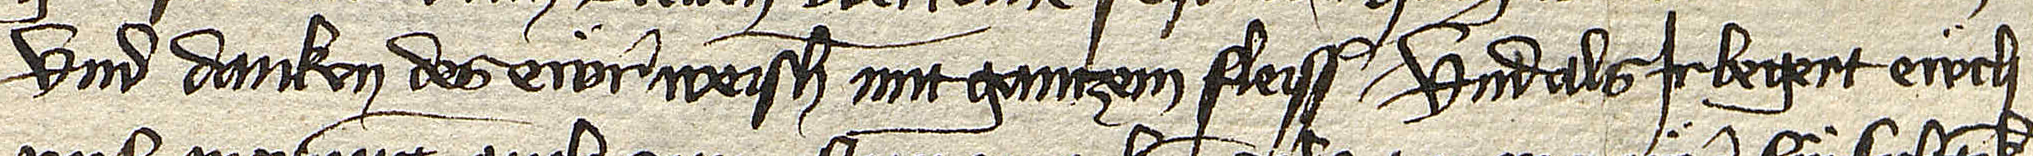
Vnd danken des eẅr* weiſh* mit gancʒem fleiſſ / Vnd als Ir begert eẅch
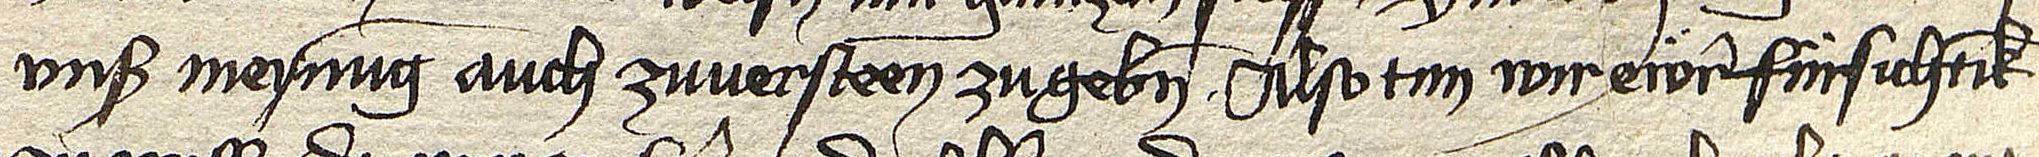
vnſ* meynu*g auch ʒuuerſteen ʒu gebn* . Alſo tun wir eẅr* fürſichtik*
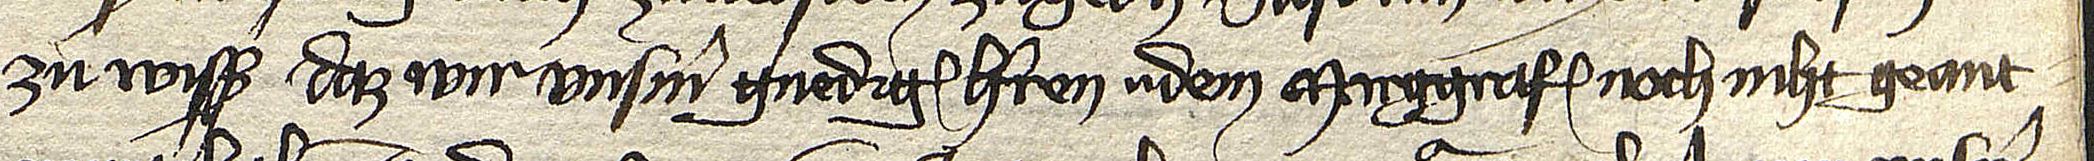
ʒu wiſſ* / daʒ wir vnſm* gnedig* h*ren ~ dem Marggraf* noch niht geant =
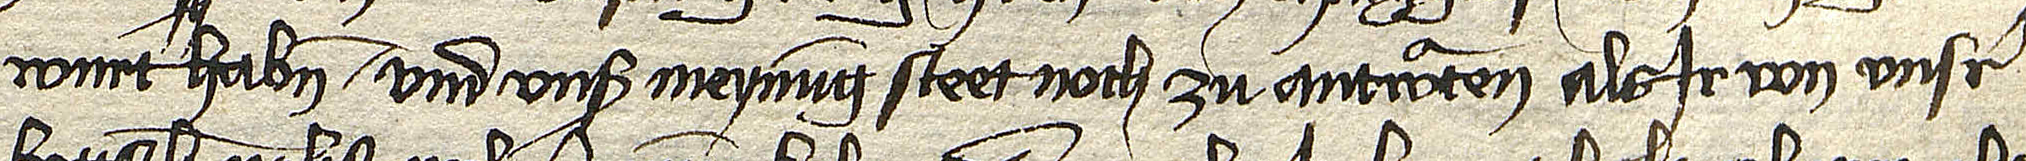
wurt habn* / vnd vnſ* meynu*g ſteet noch ʒu antw*ten als Ir von vnſr*
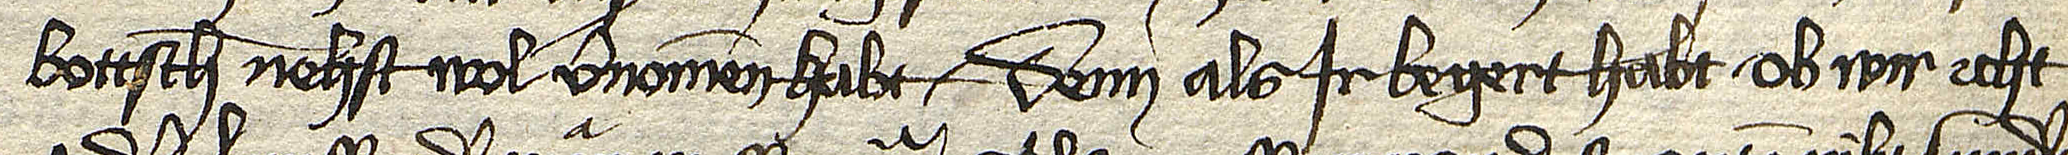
bottſch* nehſt wol v*nom*en habt / Denn als Ir begert habt / ob wir icht
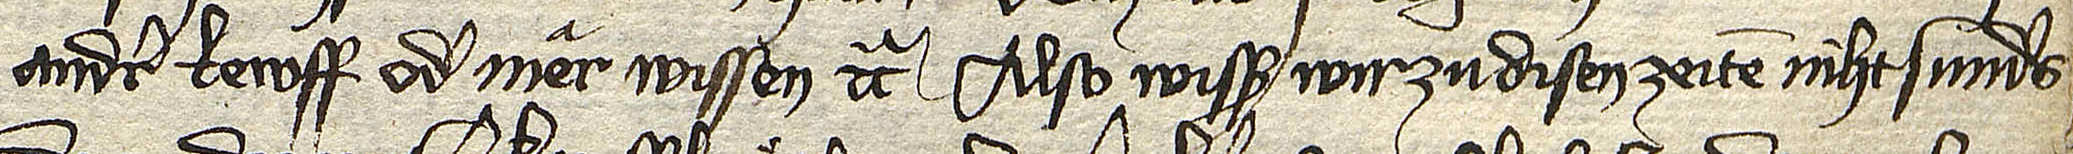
andr* lewff od* mër wiſſen ec* Alſo wiſſ* wir ʒu diſen ʒeite* niht ſund*s
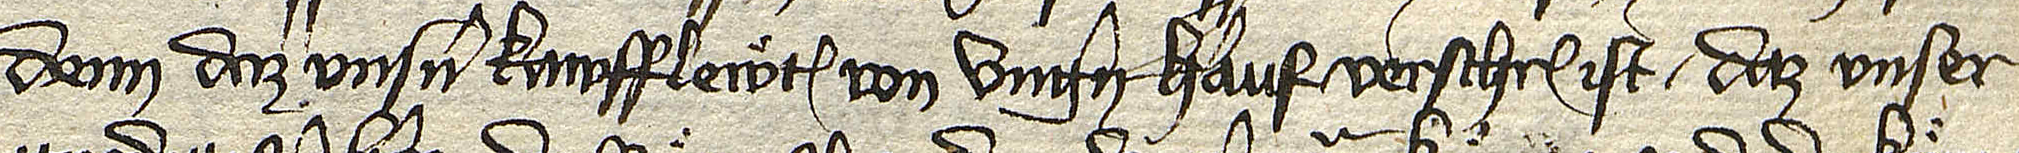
Denn daʒ vnſn* kawffleẅt* von Vng*n h*auf verſchr* iſt / Daʒ vnſer
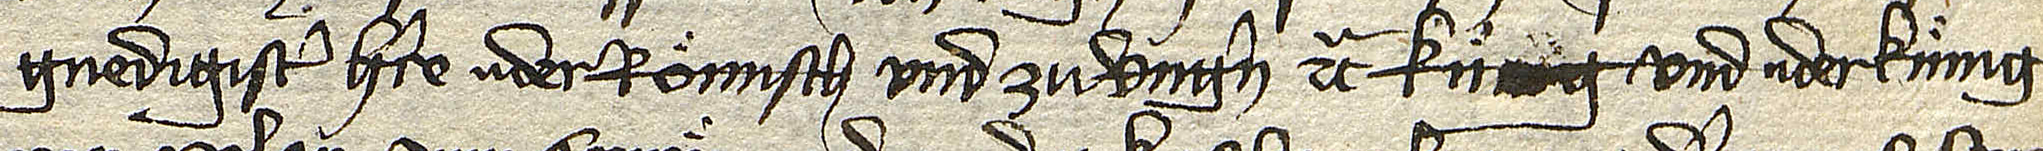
gnedigiſt* h*re ~ der Römiſch vnd ʒu Vng*n ec* künig vnd ~ der künig
